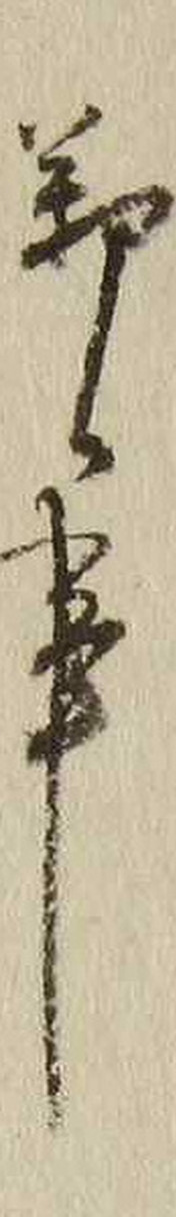勤候事
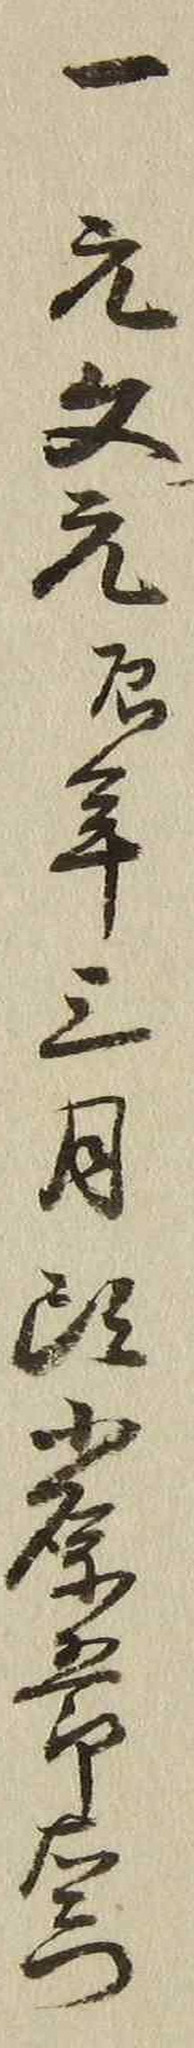一元文元辰年三月頭小原五郎右衛門
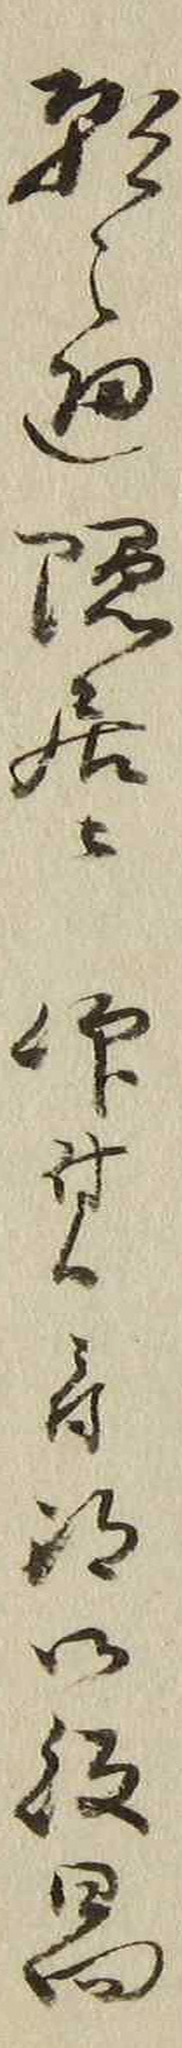願之通隠居被仰付候ニ付跡御役日向
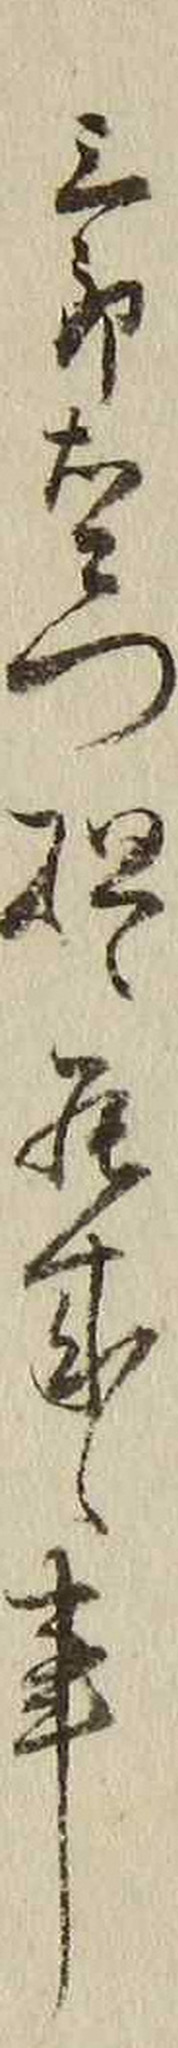三郎右衛門組ニ罷成候事
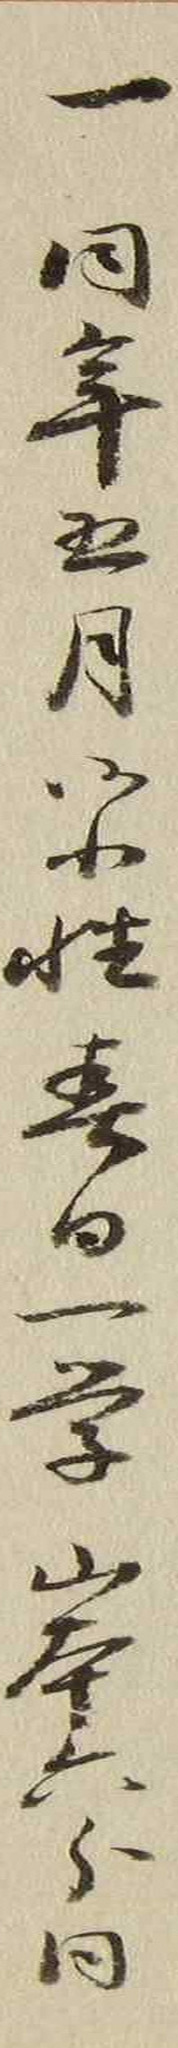一同年五月御小性春日一学山本六郎同
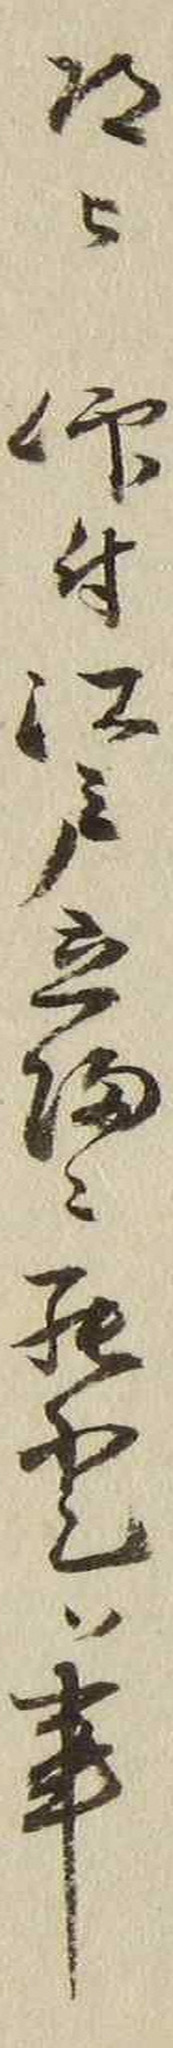跡被仰付江戸立帰ニ罷登候事
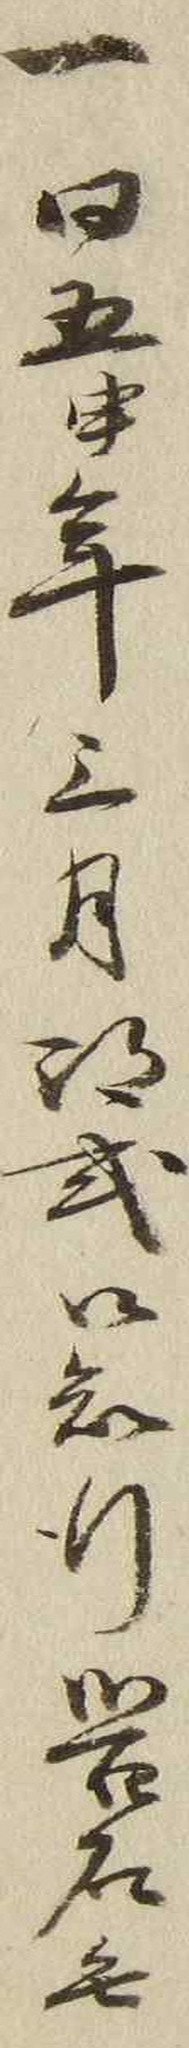一同五申年三月跡式御知行弐百石無

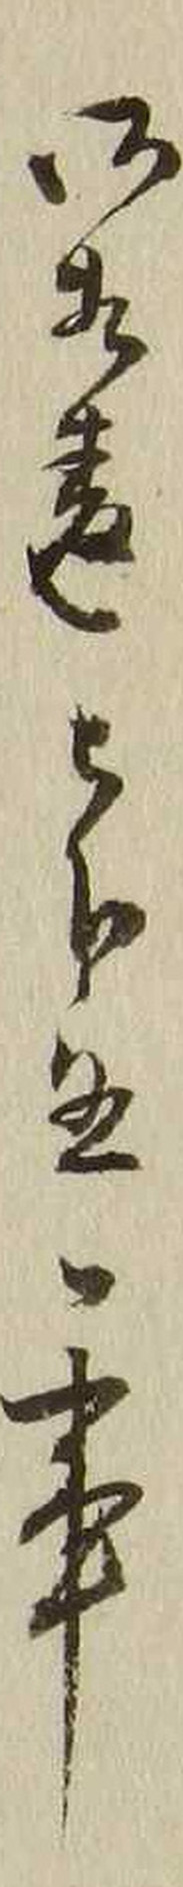御相違被下置候事
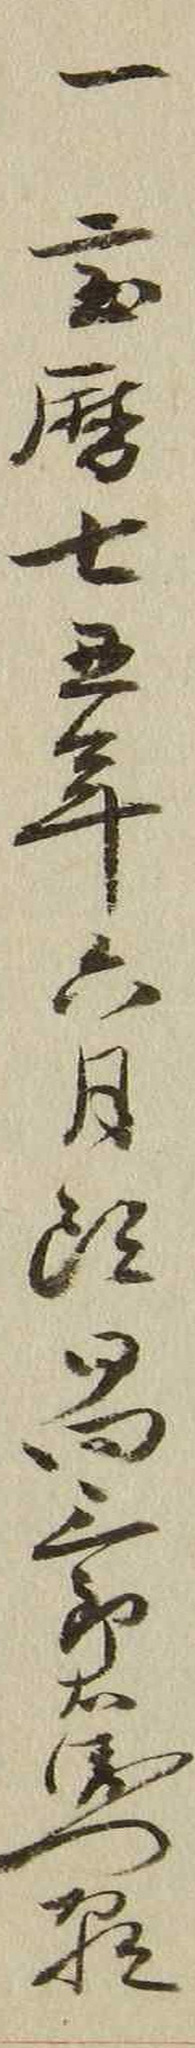一宝暦七丑年六月頭日向三郎右衛門願
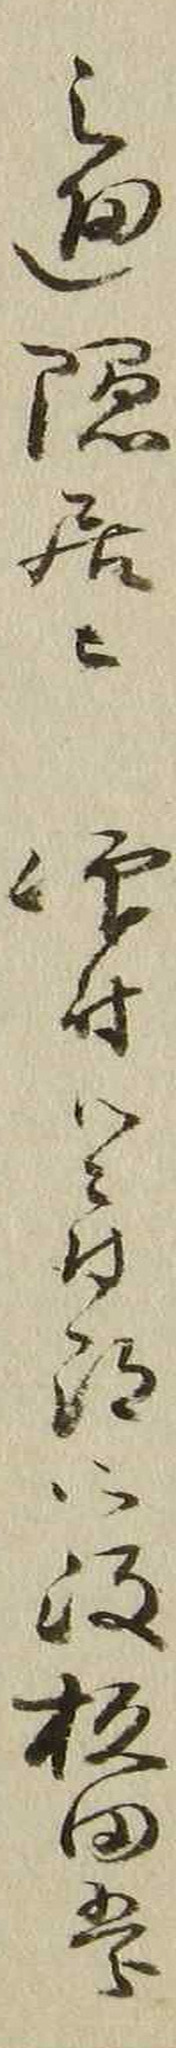之通隠居被仰付候ニ付跡御役杉田五郎
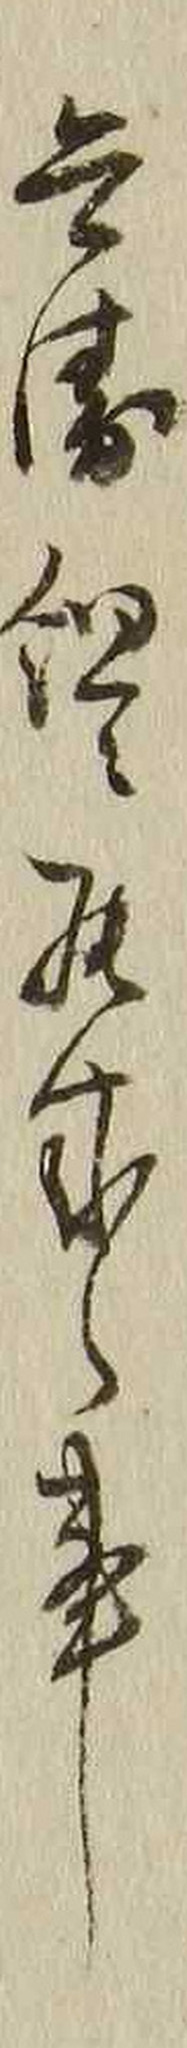兵衛組ニ罷成候事
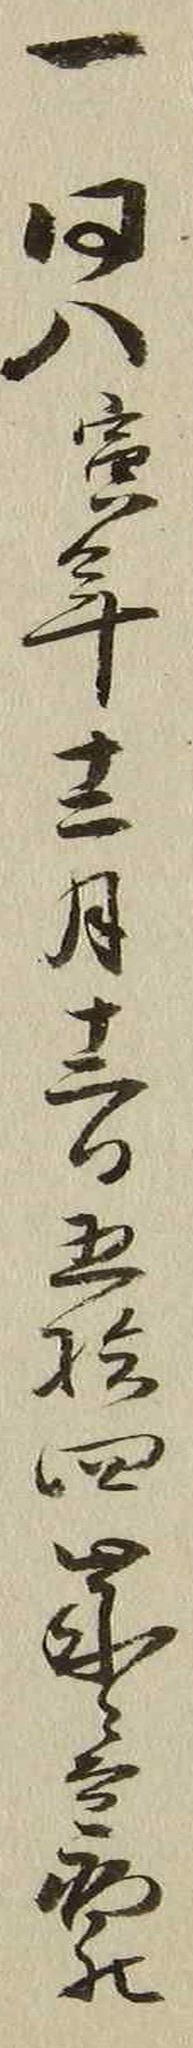一同八寅年十二月十二日五拾四歳ニ而病死
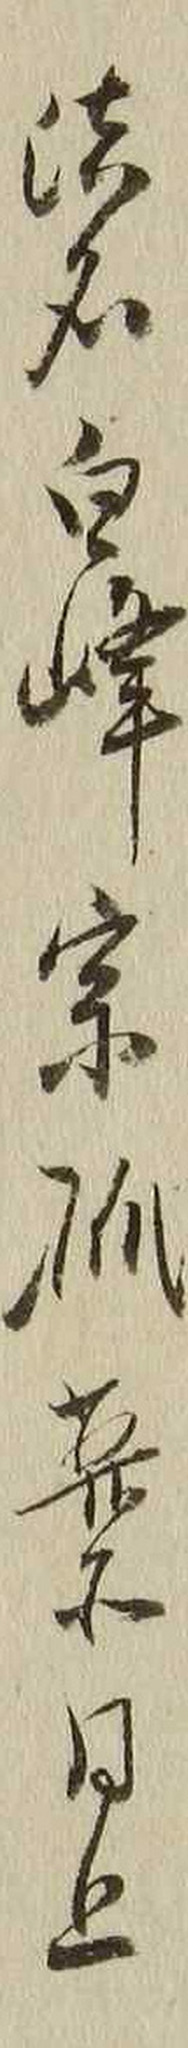法名白峰宗孤葬所同上
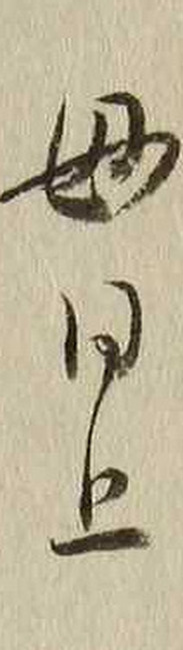母同上
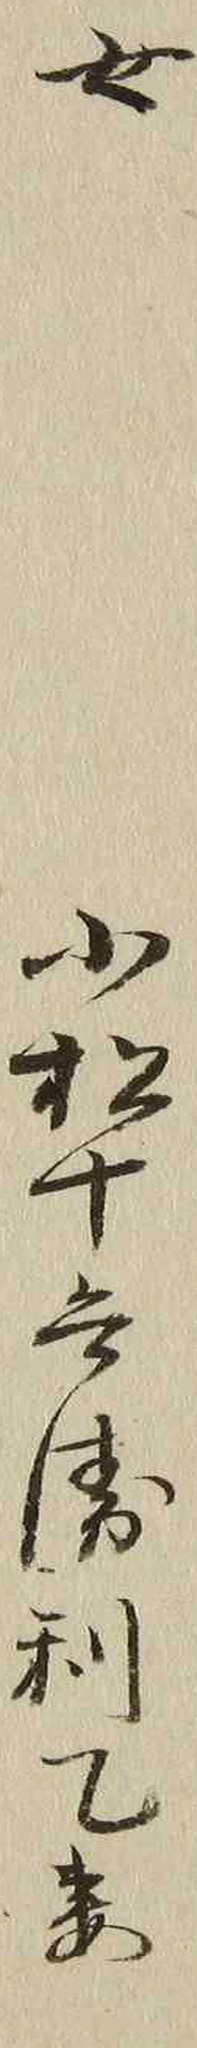女小松十兵衛利乙妻
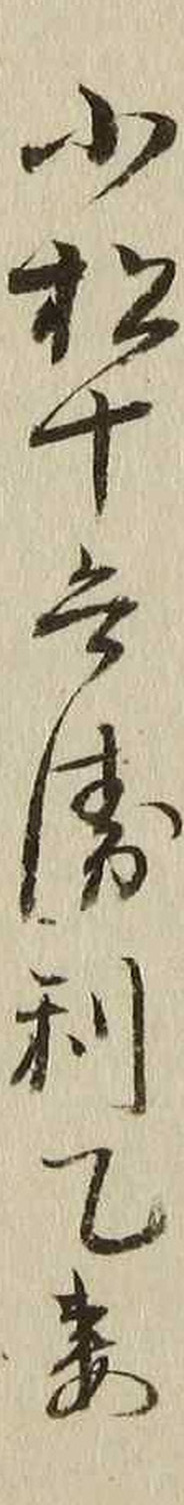女小松十兵衛利乙妻
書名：諸士系譜　巻之236　ふ之部4
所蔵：会津若松市立会津図書館
